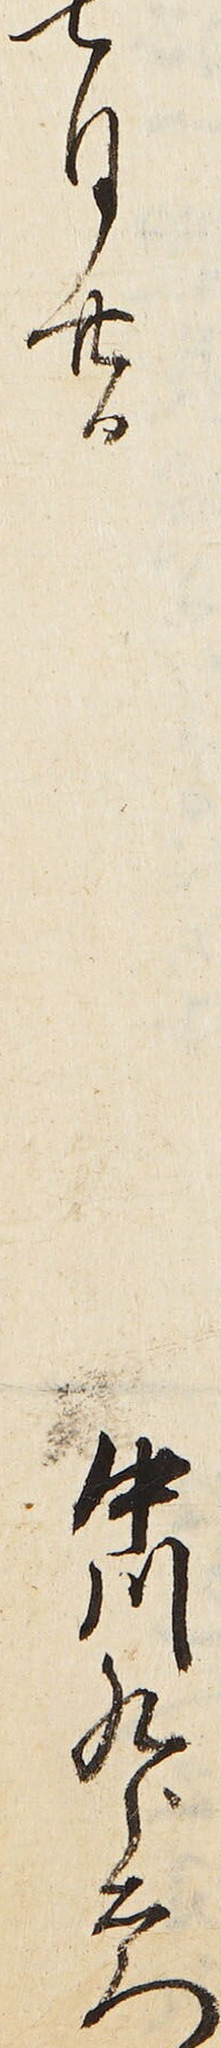七月廿日中川九郎右衛門
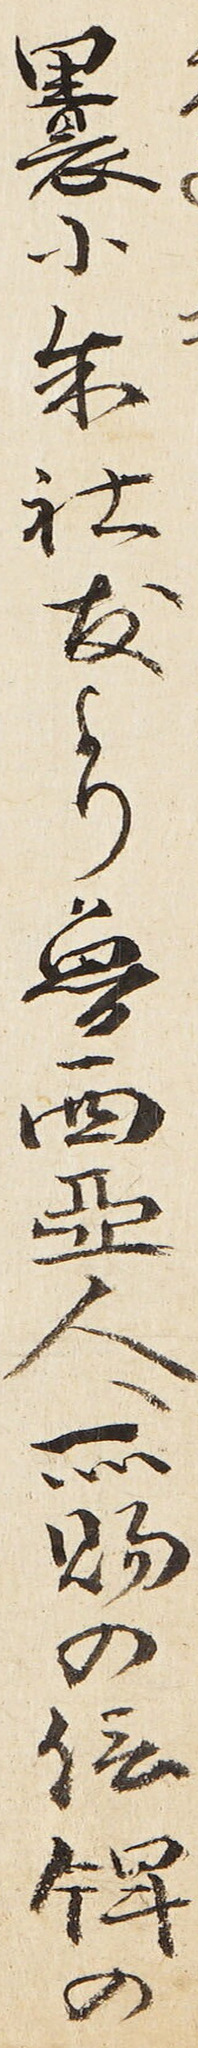裹に我社友より魯西亜人へ所賜の信牌の
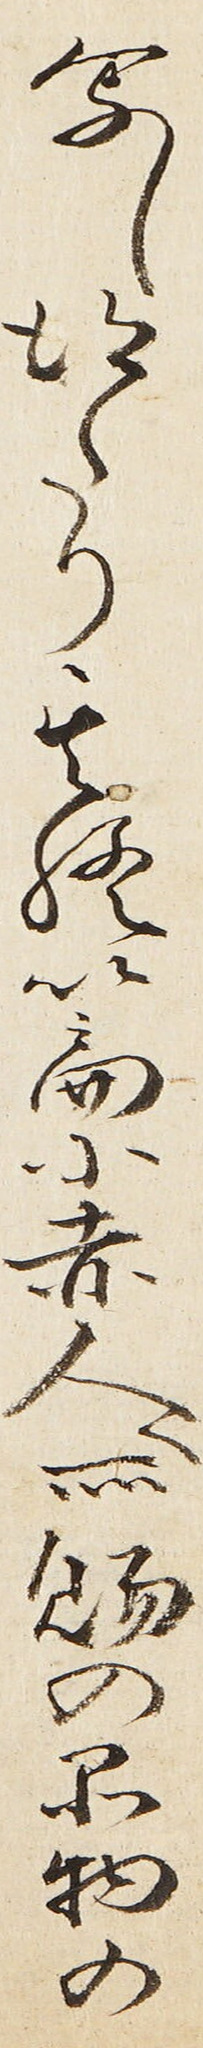写し得たり其終篇に赤人へ所賜の品物の
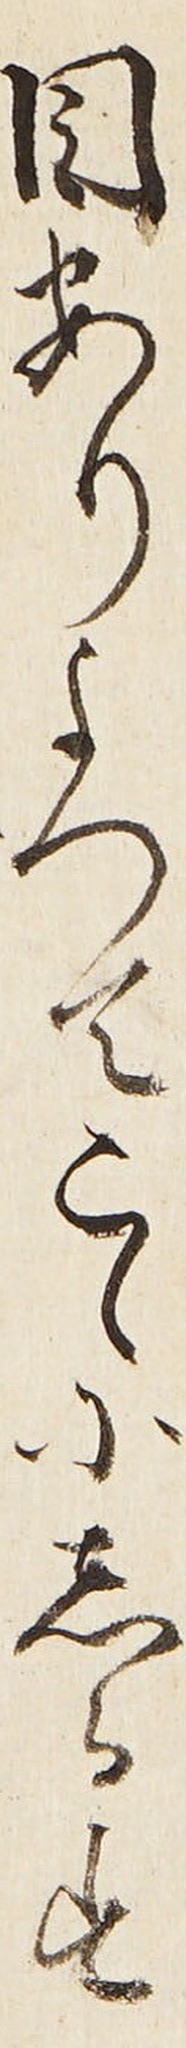目ありよつてこゝにしるす
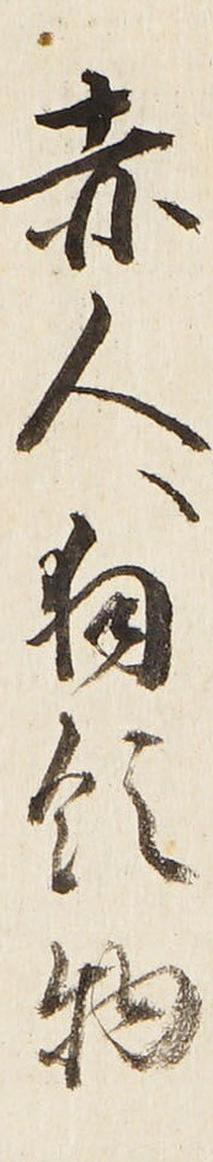赤人へ拝領物
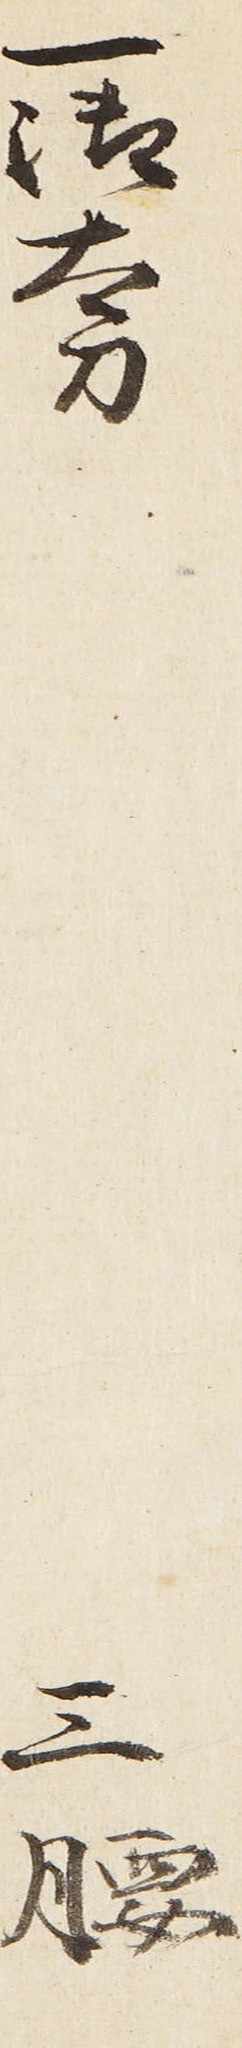一御太刀三腰
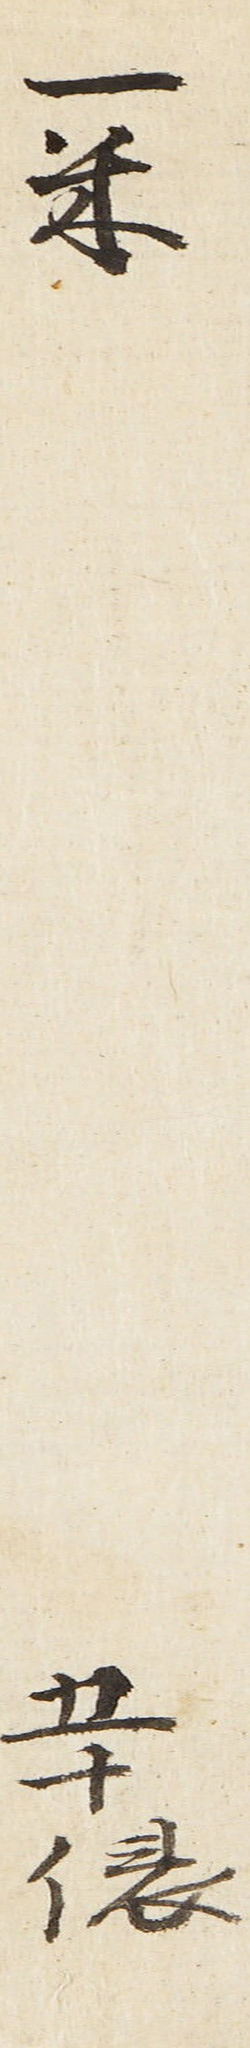一米五十俵
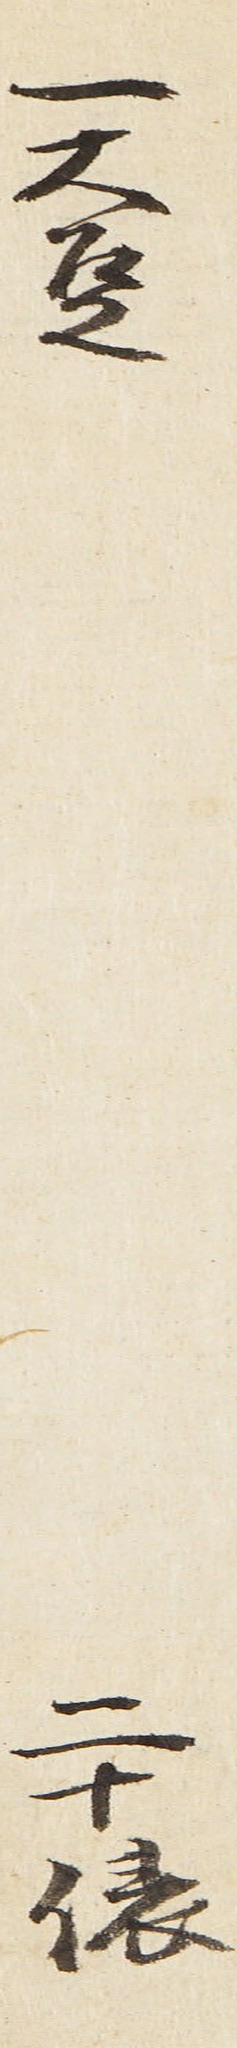一大豆二十俵
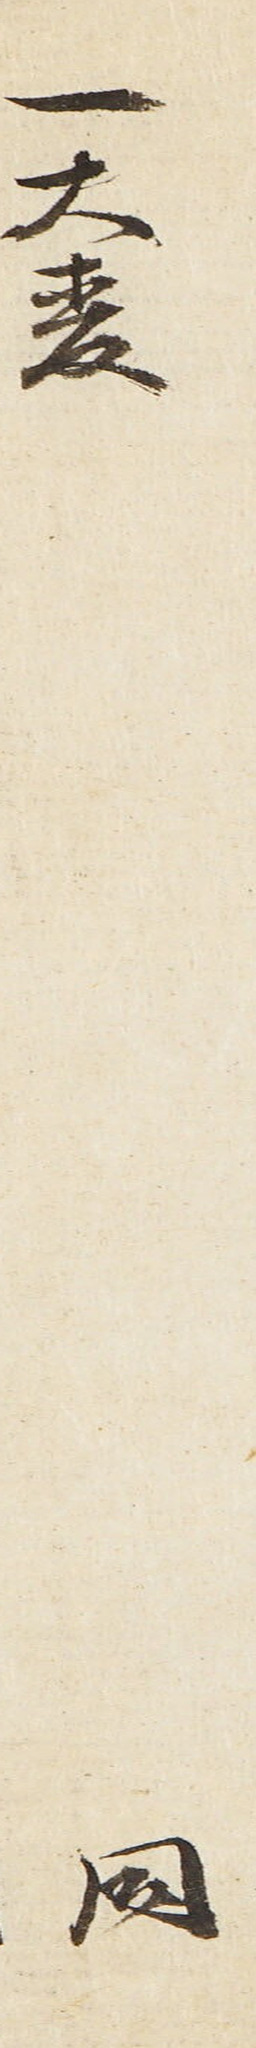一大麦同
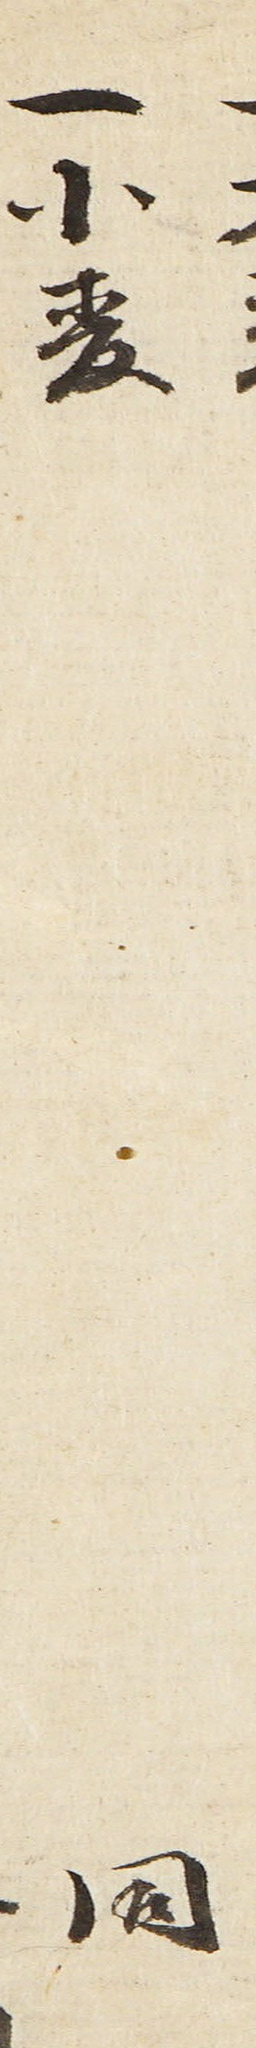一小麦同
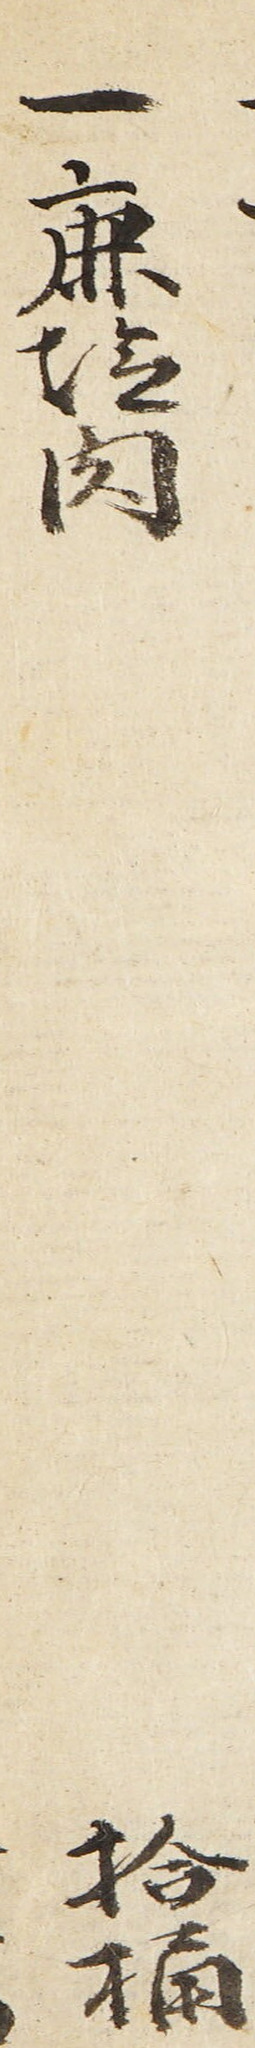一鹿塩肉十桶
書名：漂民御覧之記
